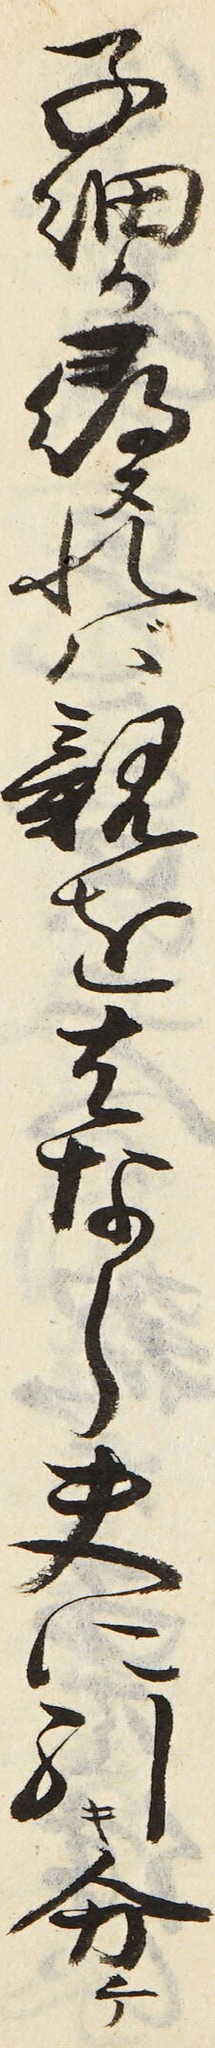子細か尋ぬれは親をはなし夫に引き分け
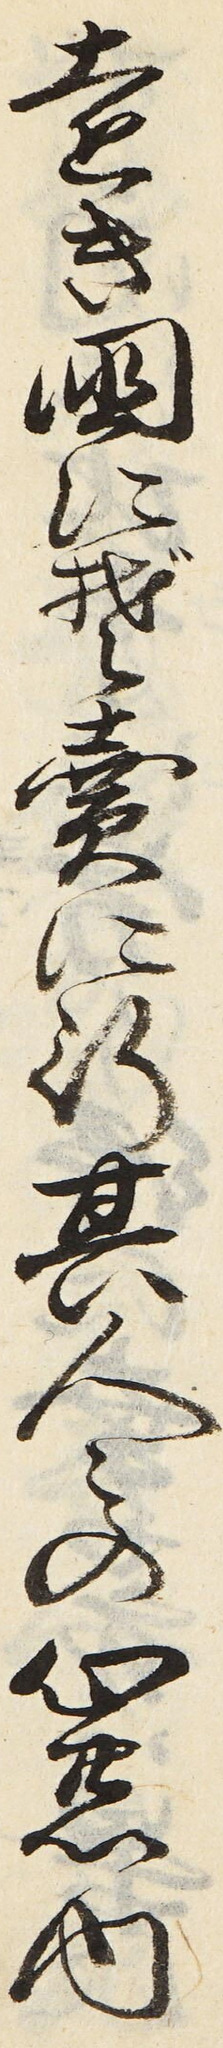遠き国にぞ売に行其人々の心の内
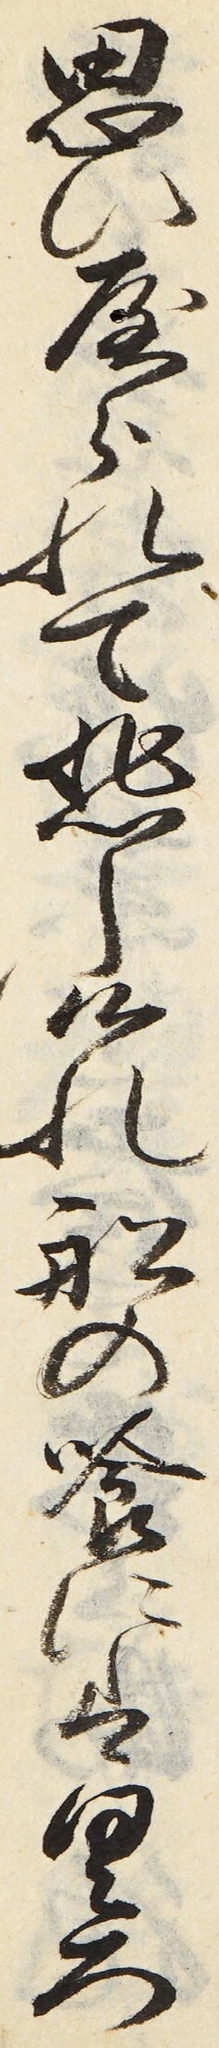思ひやられて悲しけれ船の喰にはくろ
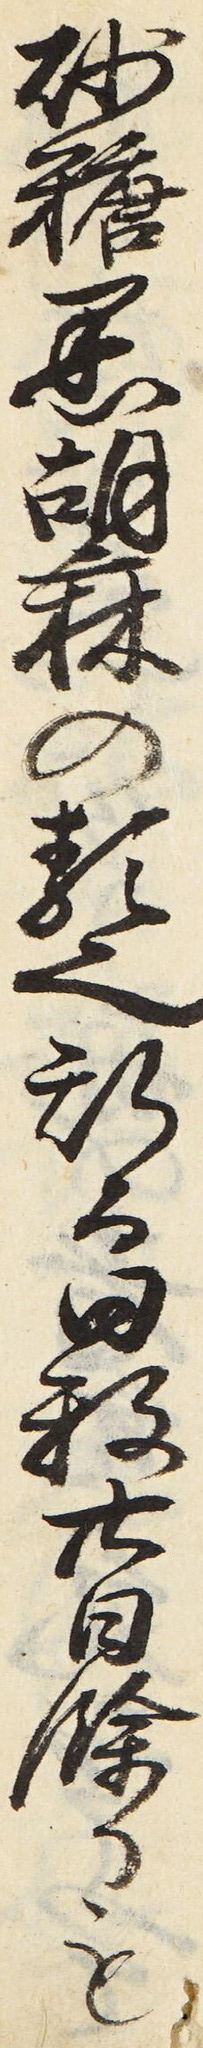砂糖黒胡麻の類也斯而日数廿日余りも
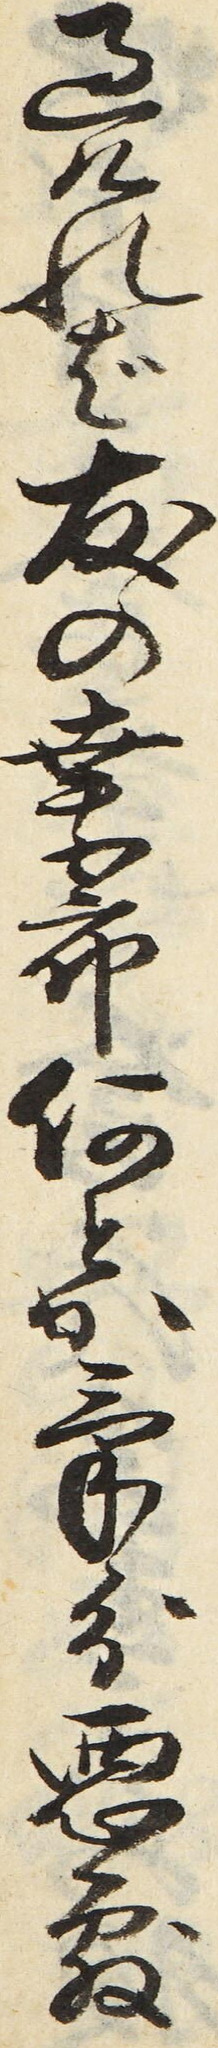過ければ友の幸五郎何とか気分悪敷

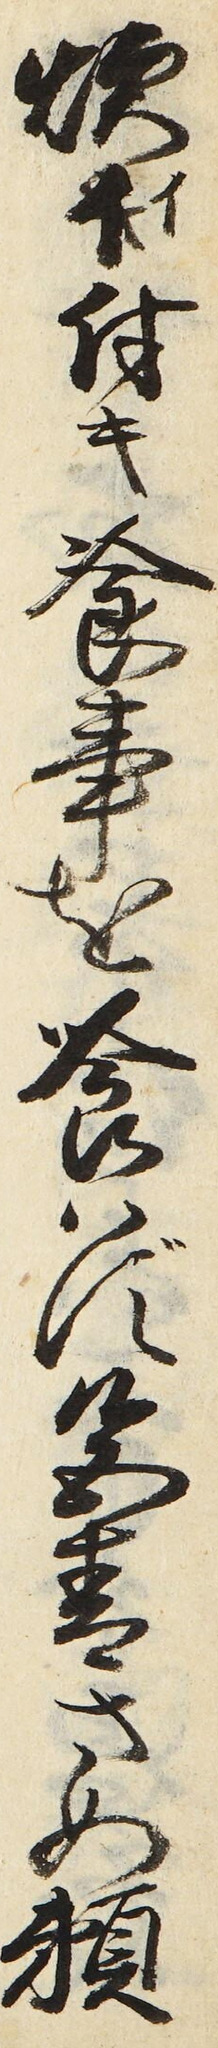煩い付き喰事を喰はす色青さめ頼
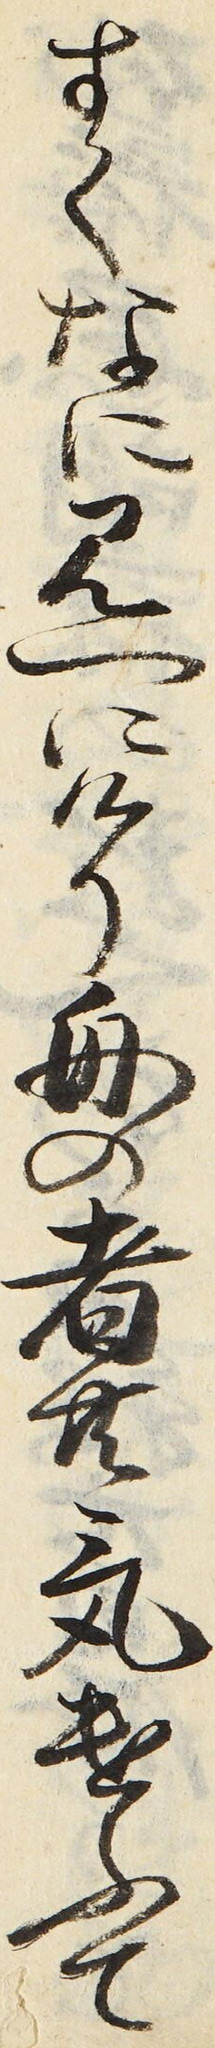すくなに見へにけり舟の者共気遣ふて
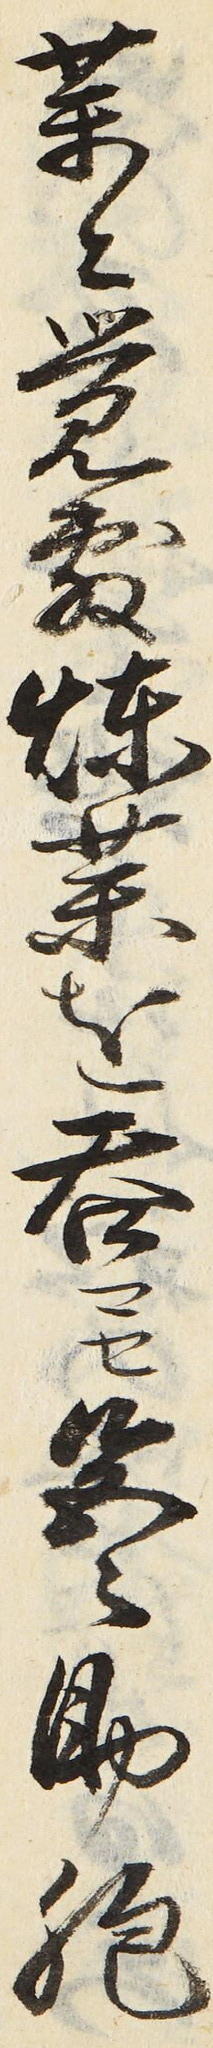薬と覚敷煉薬を呑ませ色々助抱
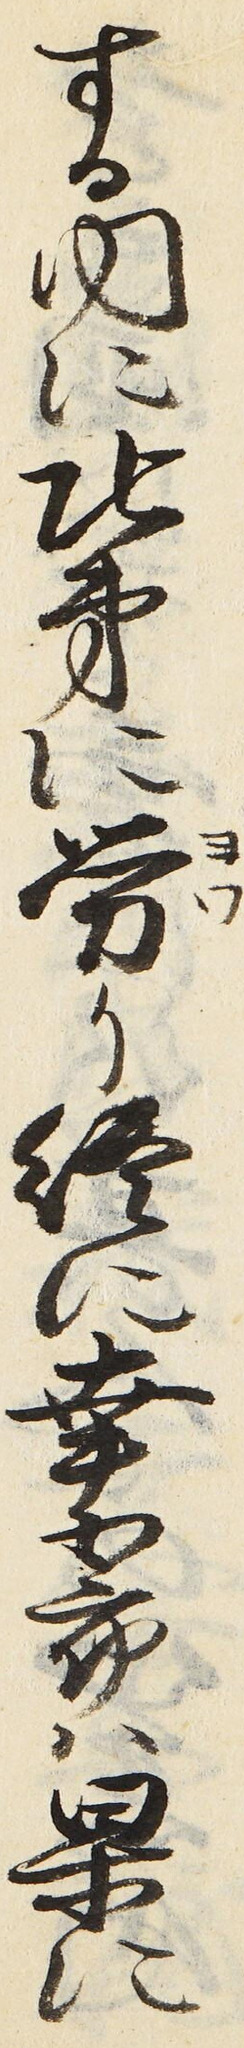する内に次第に労り終に幸五郎は果に
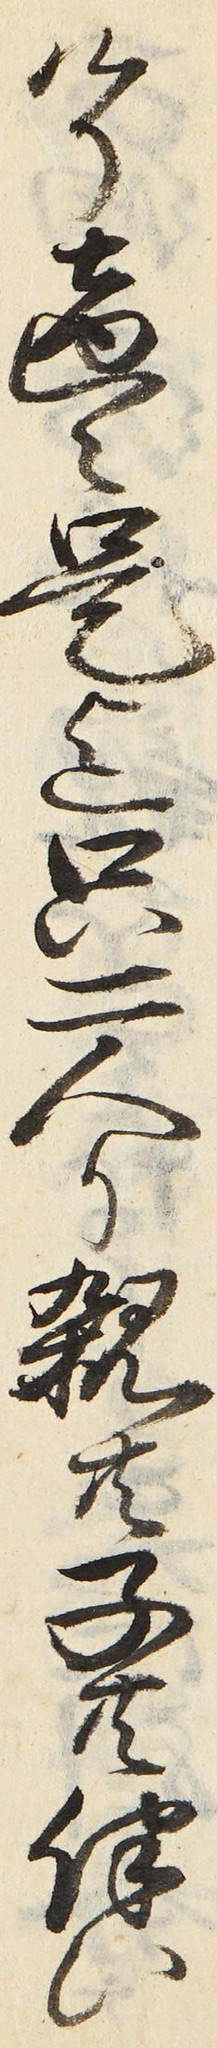けり適々是迄只二人り親共子共伴ひ
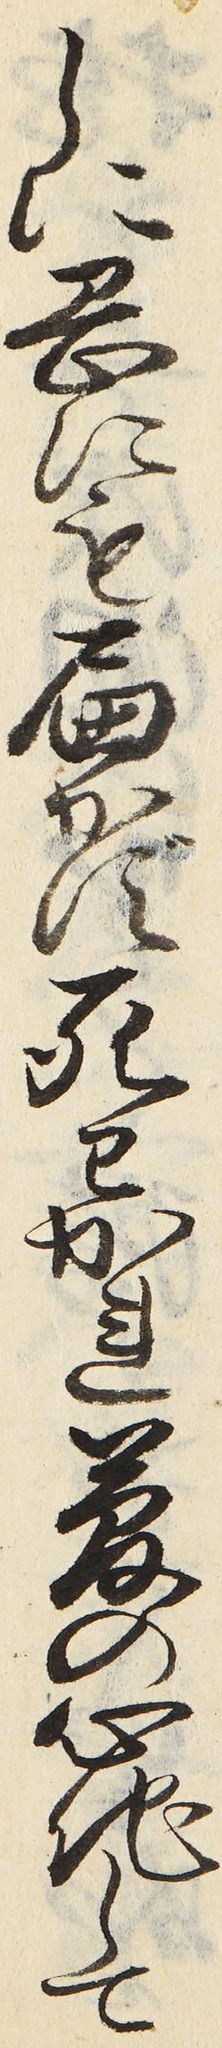しに岡にも届かず死わかれ夢の心地して
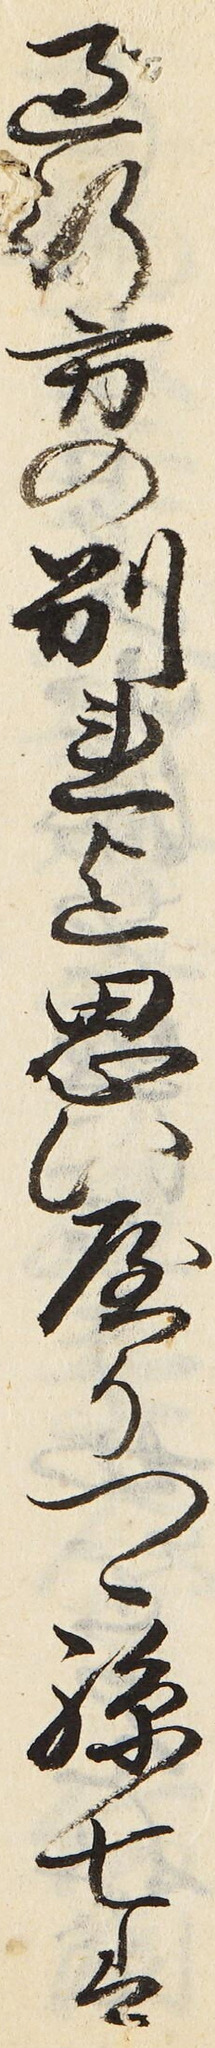過行方の別れ迠思ひやりつゝ孫七は
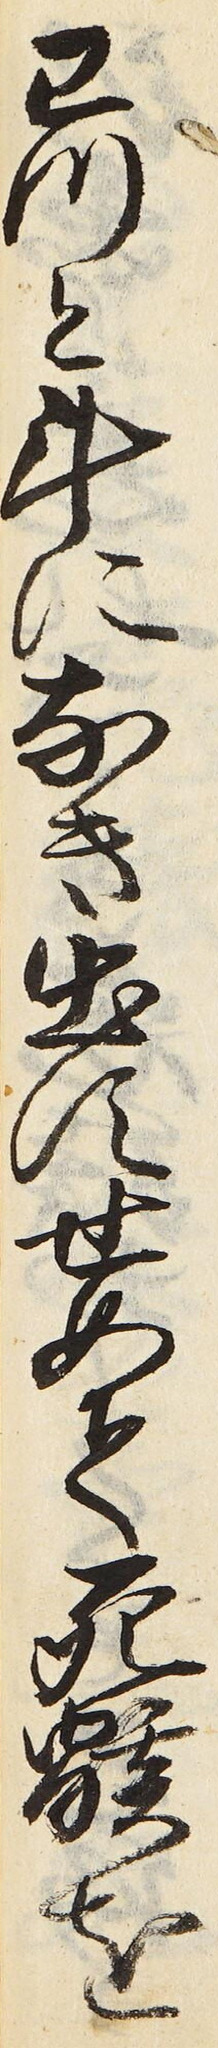わつと計になき出すせめて死骸を
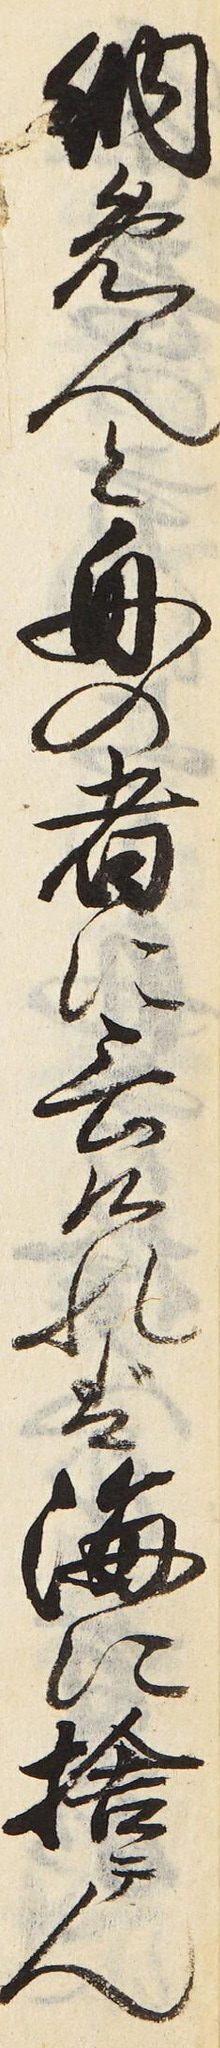納めんと舟の者に云ければ海に捨てん
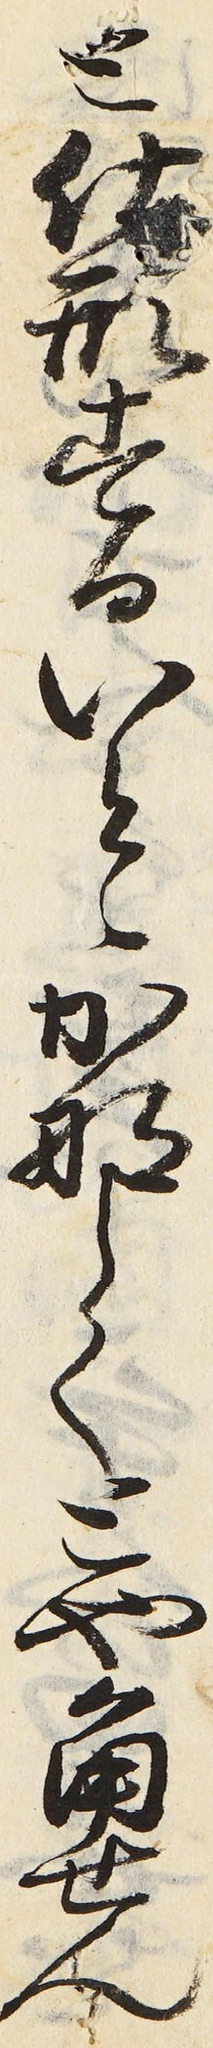と仕形するいとゝかなしくとや角せん
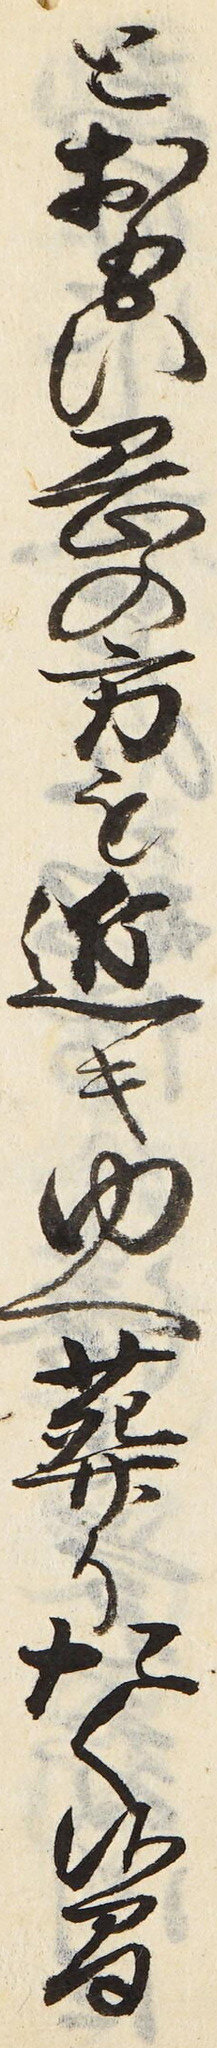とおもひ岡の方も近きゆへ葬りたく候間
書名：華夷九年録
